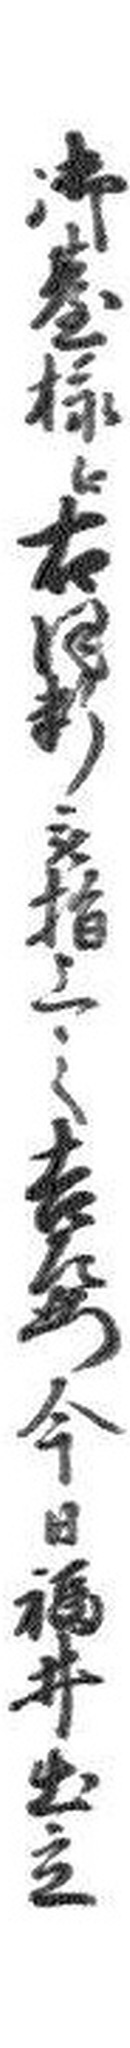御台様江右同断被指上之吉左衛門今日福井出立
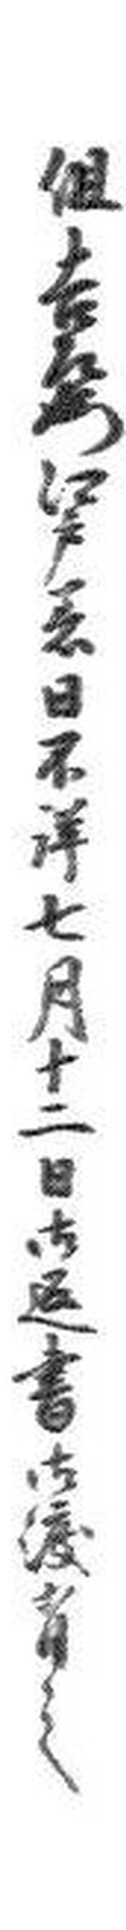但吉左衛門江戸着日不詳七月十二日御返書御渡有之
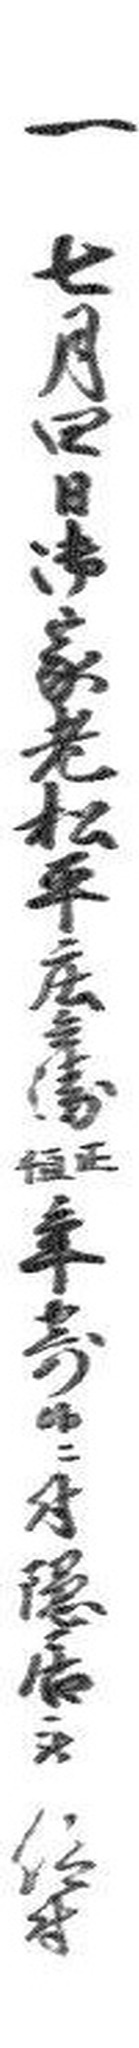一七月四日御家老松平庄兵衛正恒年寄候ニ付隠居被仰付

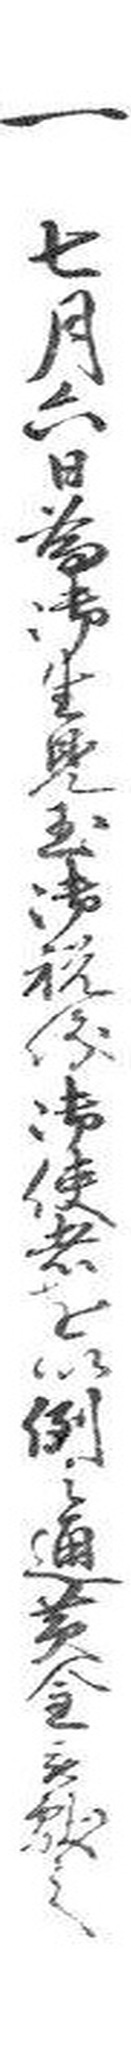一七月六日為御生見玉御祝儀御使者を以例之通黄金被献之
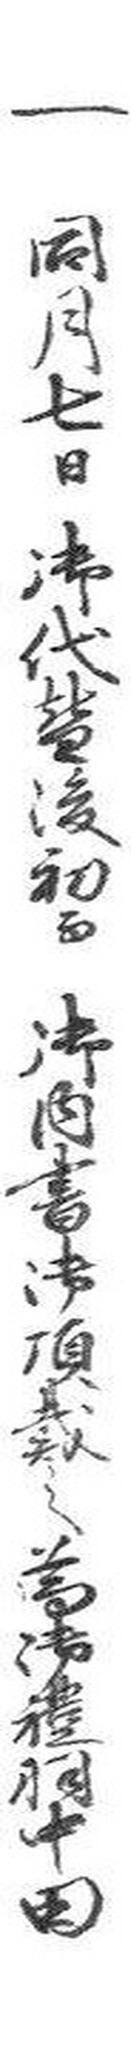一同月七日御代替後初而御内書御頂戴之為御礼羽中田
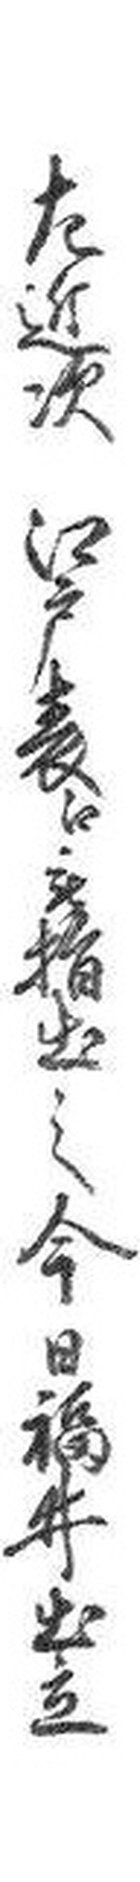左近次江戸表江被指出之今日福井出立
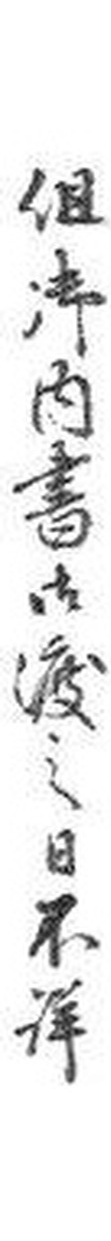但御内書御渡之日不詳
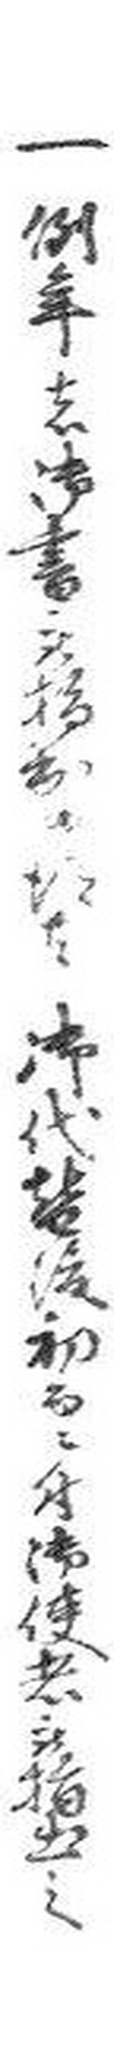一例年者御書被指出候得共御代替後初而ニ付御使者被指出之
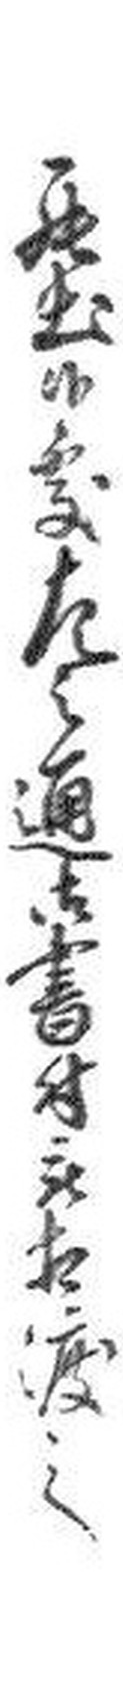罷出候処左之通御書付被相渡之
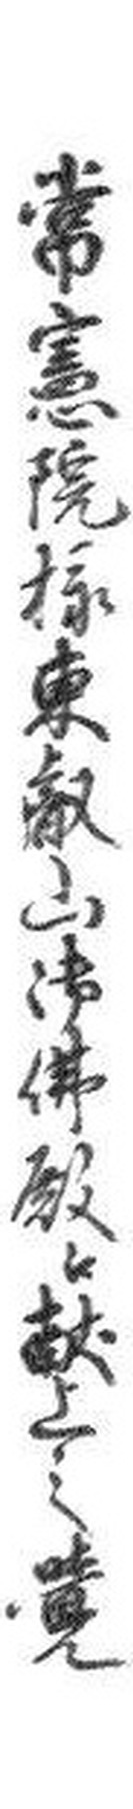常憲院様東叡山御仏殿江献上之覚
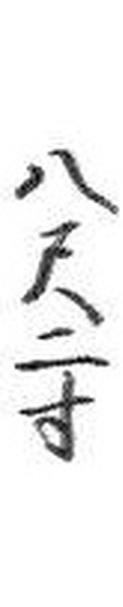八尺二寸
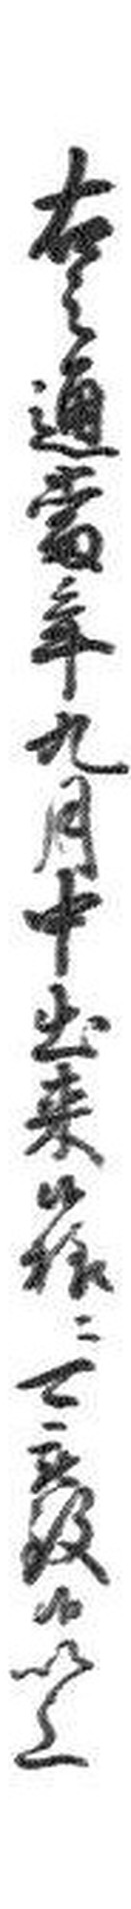右之通当年九月中出来候様ニ可被致候以上
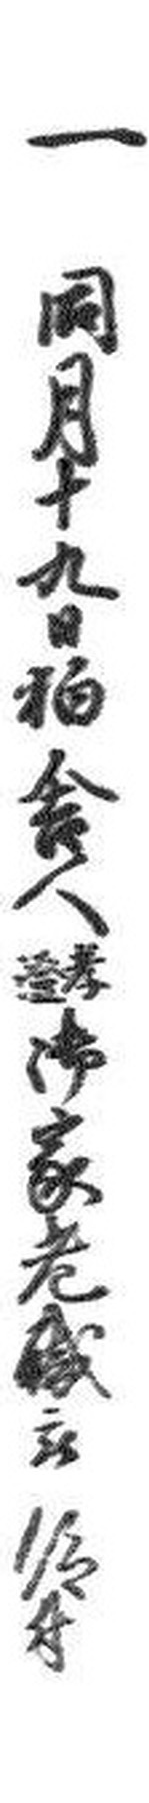一同月十九日柏舎人孝澄御家老職被仰付
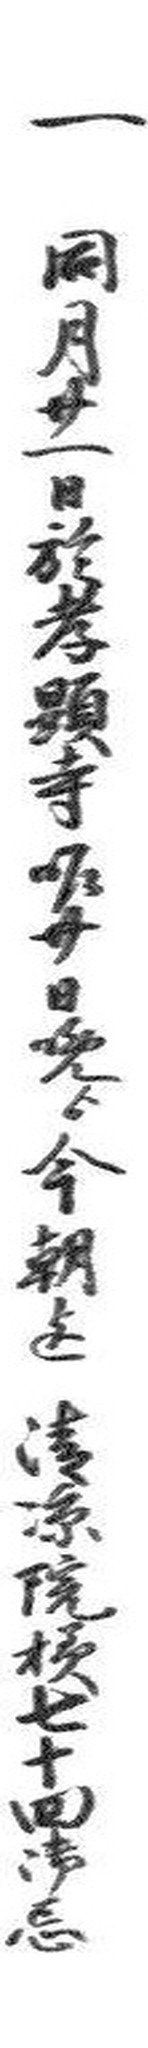一同月廿一日於孝顕寺昨廿日晩ゟ今朝迄清凉院様七十回御忌
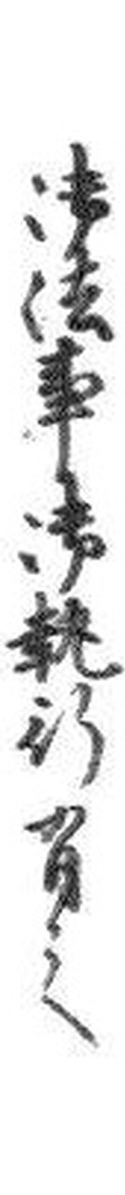御法事御執行有之
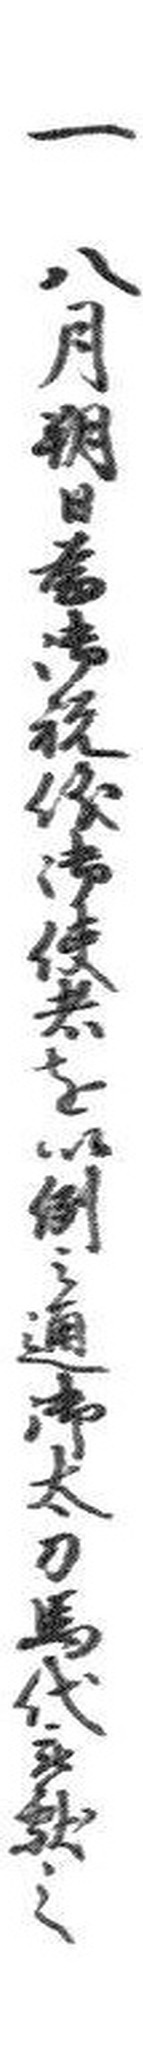一八月朔日為御祝儀御使者を以例之通御太刀馬代被献之
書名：家譜 二十五 吉品公 従宝永六年到同七年
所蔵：福井県文書館 Fukui Prefectural Archives
